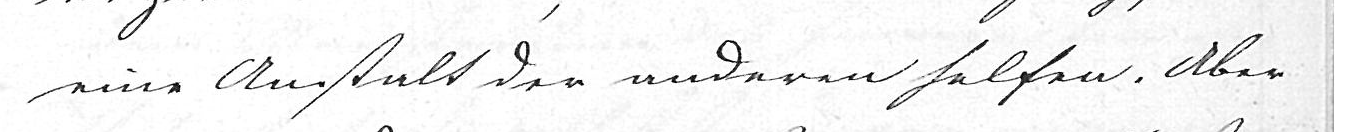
eine Anstalt der anderen helfen. Aber
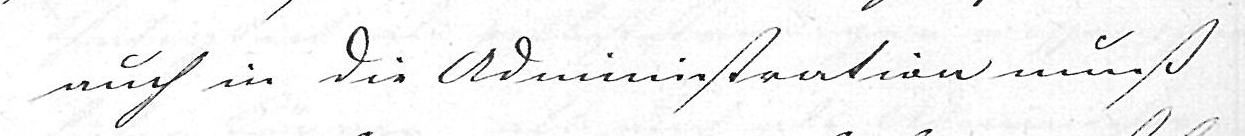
auch in die Administration muß
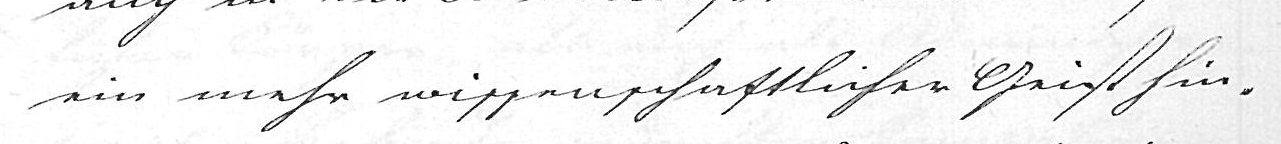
ein mehr wissenschaftlicher Geist hin-
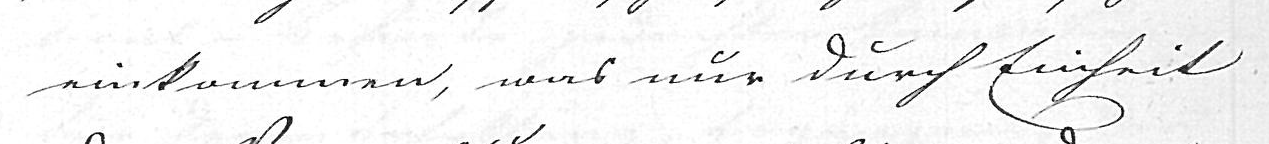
einkommen, was nur durch Einheit
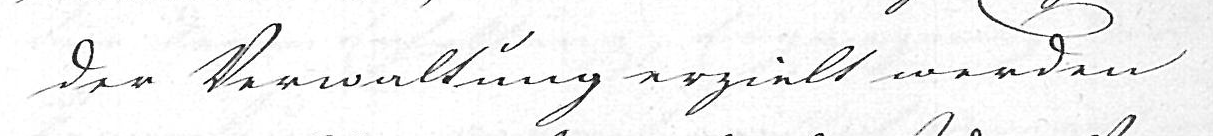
der Verwaltung erzielt werden
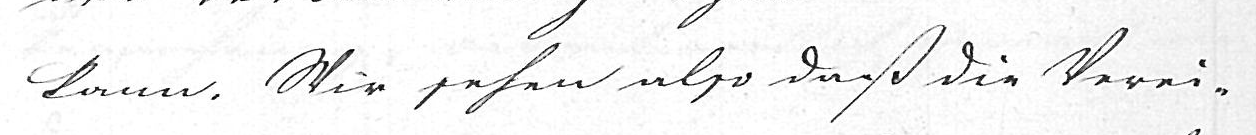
kann. Wir sehen also daß die Verei-
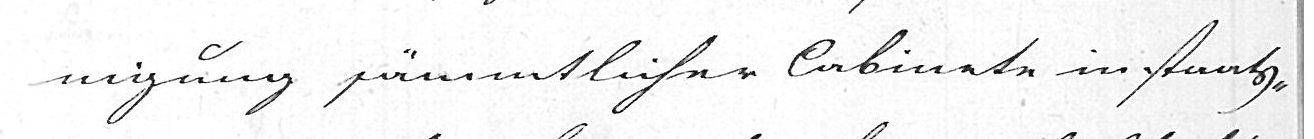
nigung sämmtliche Cabinete in staats-
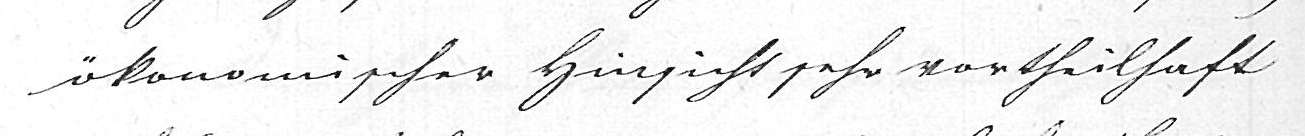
okonomischer Hinsicht sehr vortheilhaft
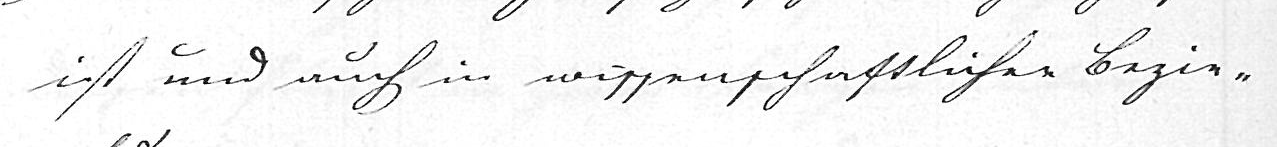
ist und auch in wissenschaftlicher Bezie-
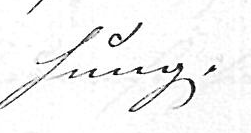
hung.
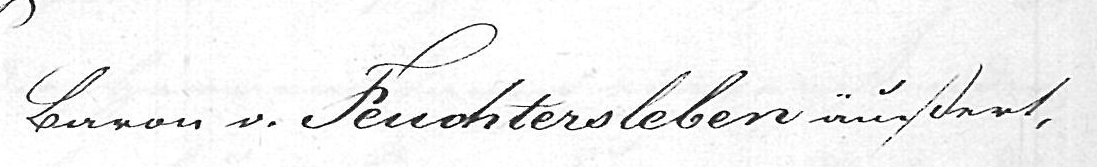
Baron v. Feuchtersleben äußert,
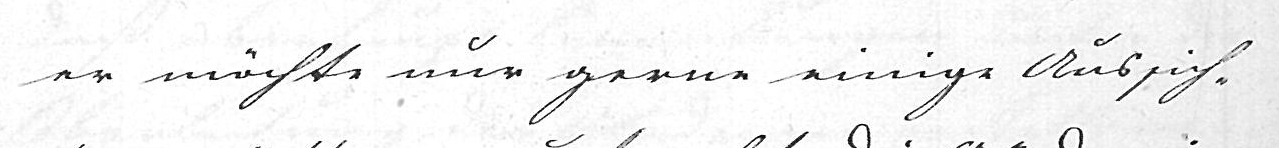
er möchte nur gerne eine Aussich-
